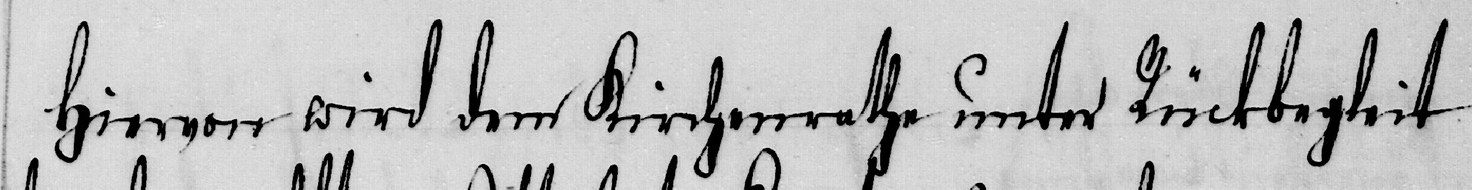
Hiervon wird dem Kirchenrathe unter Rückbegleit
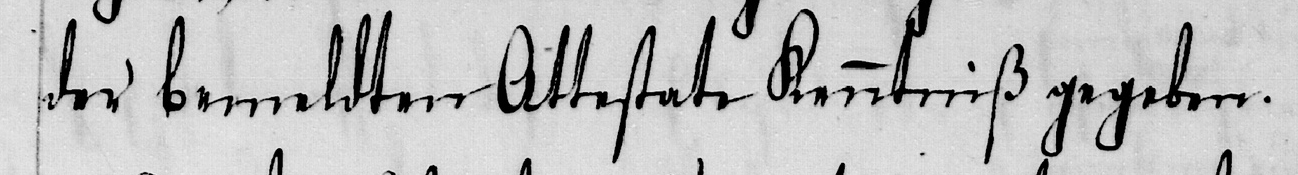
der bemeldten Attestate Kenntniß gegeben.
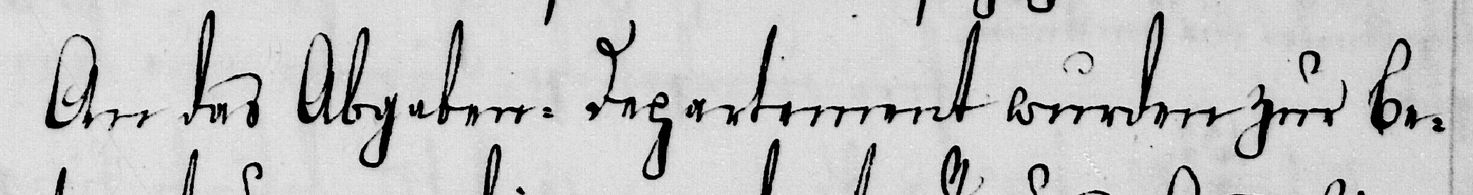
An das Abgaben-Departement wurden zur Be¬
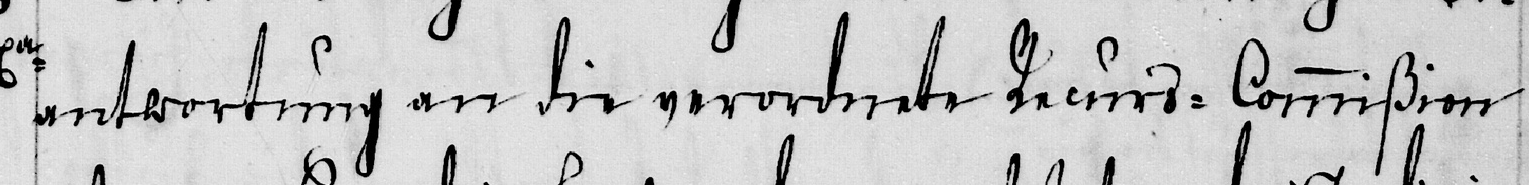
antwortung an die verordnete Recurs-Commißion
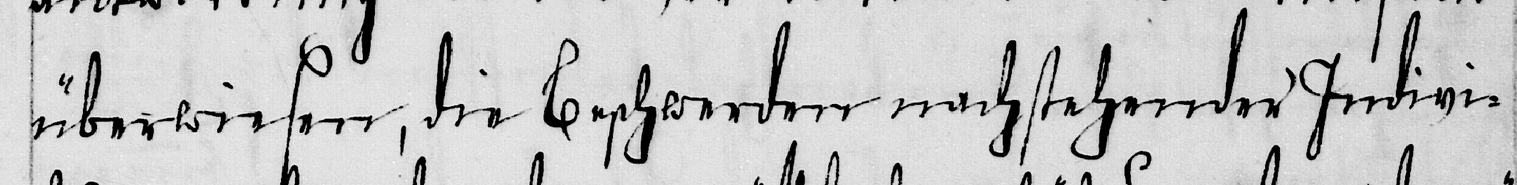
überwiesen, die Beschwerden nachstehender Indivi¬
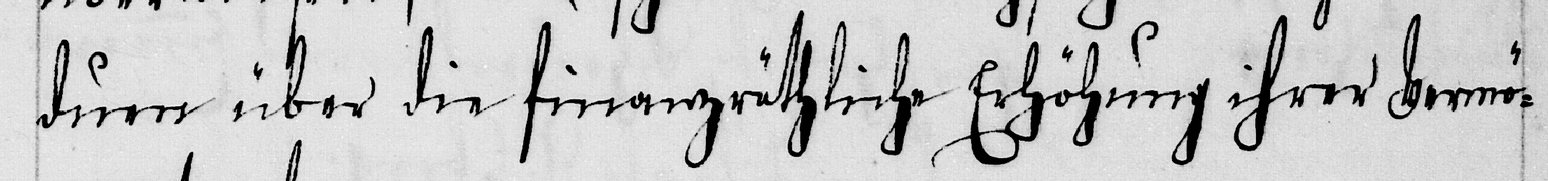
duen über die finanzräthliche Erhöhung ihrer Vermö¬
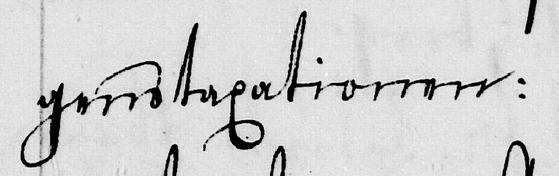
genstaxationen:
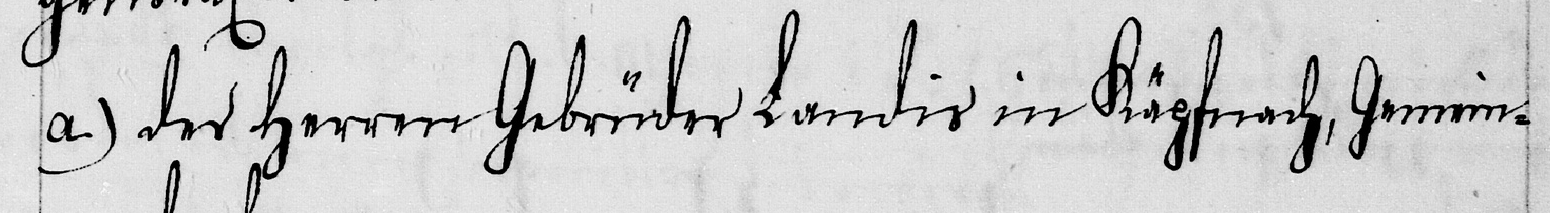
a.) der Herren Gebrüder Landis in Käpfnach, Gemein¬
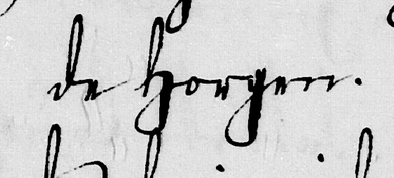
de Horgen.
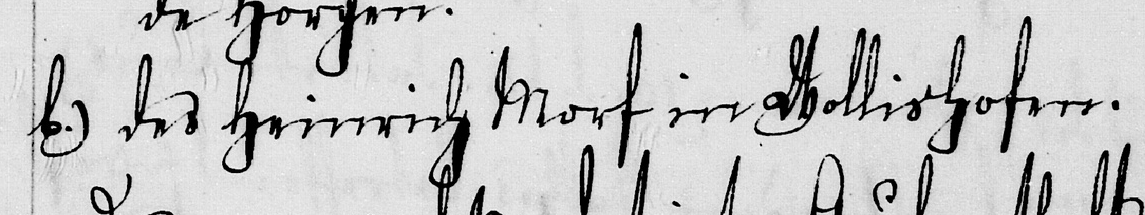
b.) des Heinrich Morf in Wollishofen.
